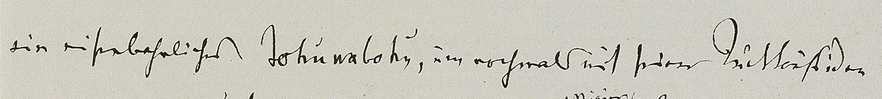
ein eisenbahnliches Tohuwabohu, um nochmals mit seinen Rückkaufsideen
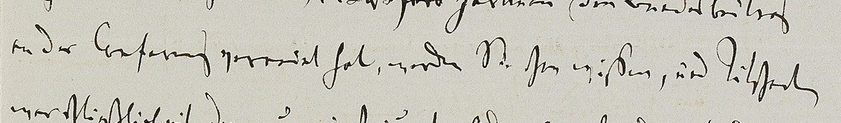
an der Conferenz verneint hat, werden Sie schon wissen, und Ritschart
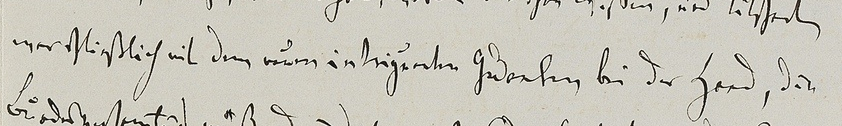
war schließlich mit dem neuen intriguanten Gedanken bei der Hand, die
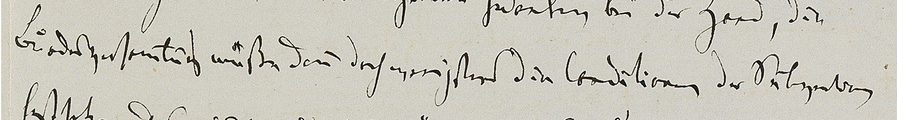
Bundesversammlung müße dann doch wenigstens die Conditionen der Subvention
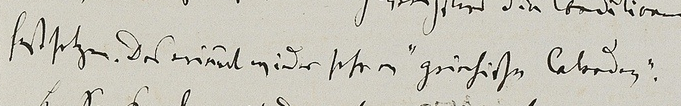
festsetzen. Das erinnert wieder sehr an «griechischeCaboden».
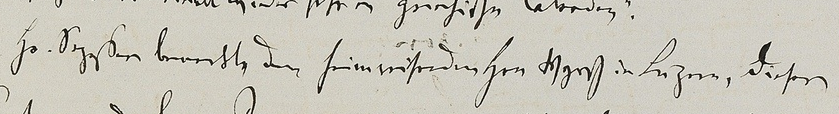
Hr. Segesser bemerkte dem heimreisenden Hrn Wyrsch in Luzern, dieser
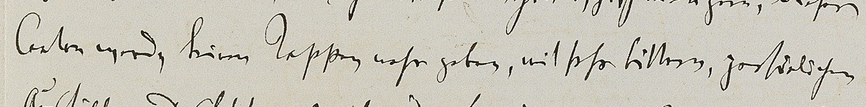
Canton werde keinen Rappen mehr geben, mit sehr bittern, persönlichen
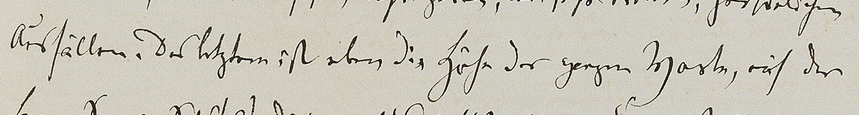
Ausfällen. Das letztere ist aber die Höhe der ganzen Warte, auf der
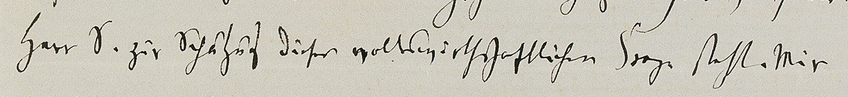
Herr S. zur Schätzung dieser volkswirthschaftlichen Frage steht. Mir
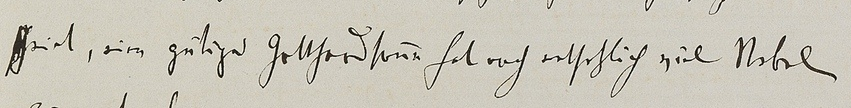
scheint, eine gütige Gotthardsonne hat noch entsetzlich viel Nebel
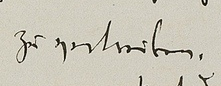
zu vertreiben.
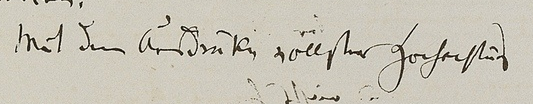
Mit dem Ausdrucke vollster Hochachtung
